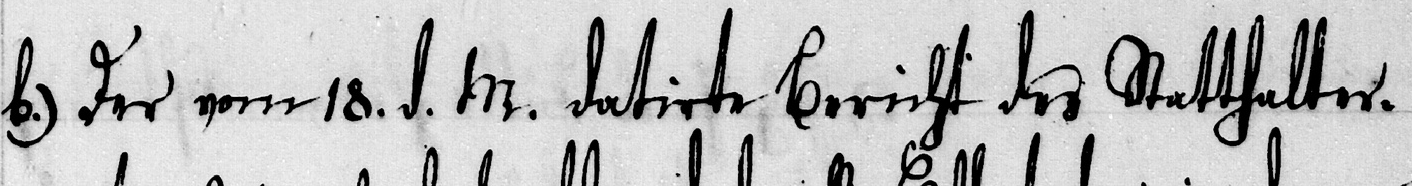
b.) Der vom 18. d. M. datirte Bericht des Statthalter¬
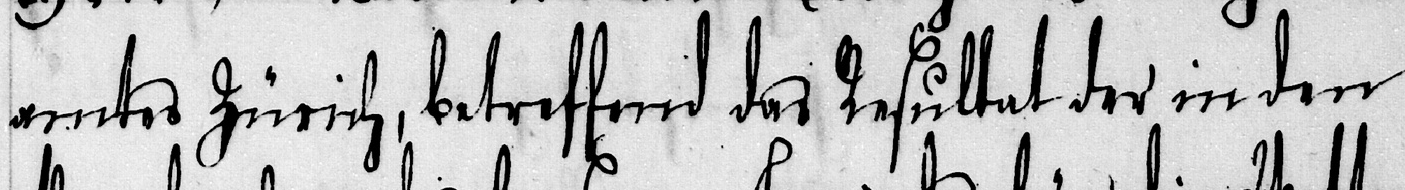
amtes Zürich, betreffend das Resultat der in den
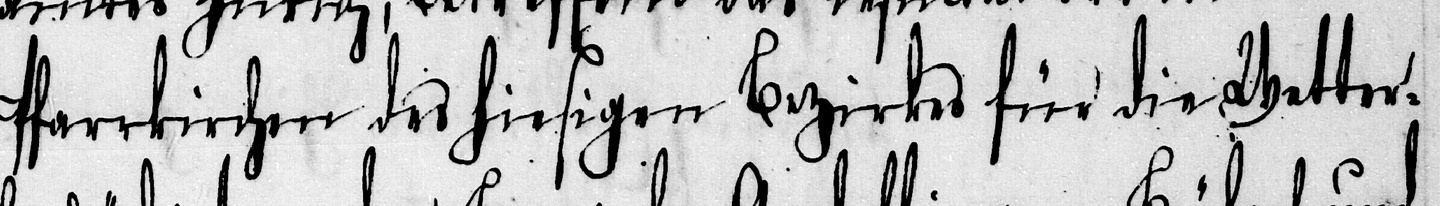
Pfarrkirchen des hiesigen Bezirkes für die Wetter¬
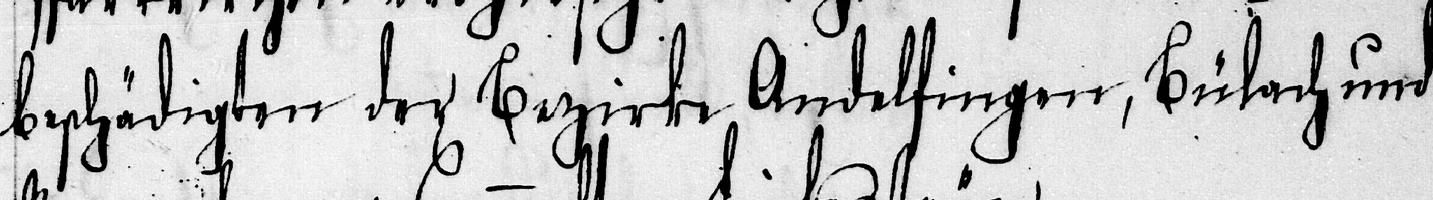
beschädigten der Bezirke Andelfingen, Bülach und
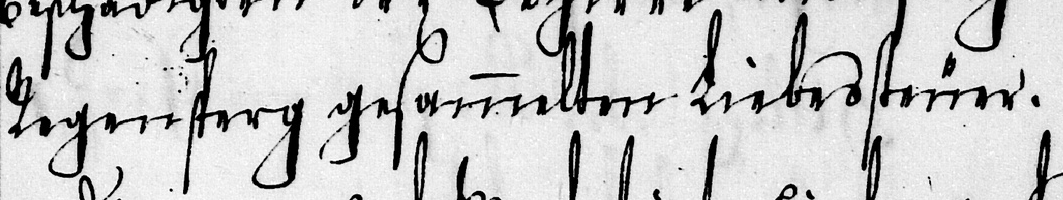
Regensperg gesammelten Liebessteuer.
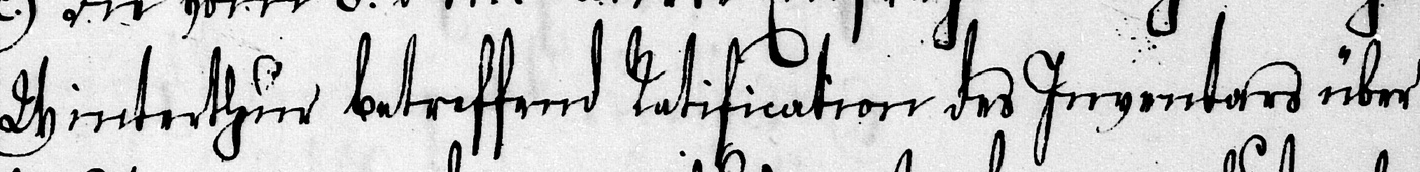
Winterthur betreffend Ratification des Inventars über
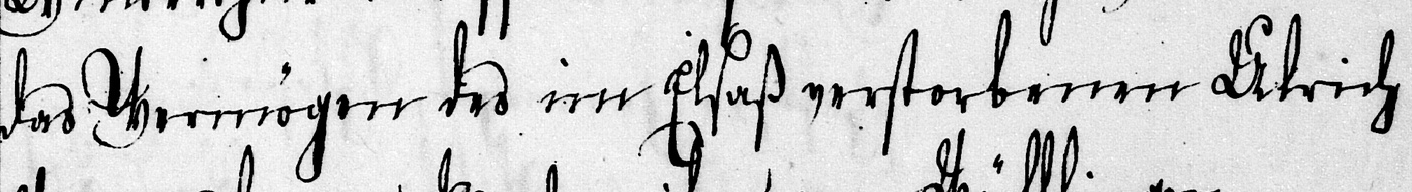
das Vermögen des im Elsaß verstorbenen Ulrich
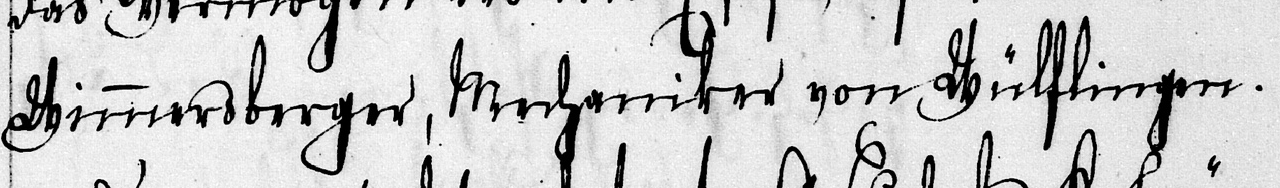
Wimmersberger, Mechaniker von Wülflingen.
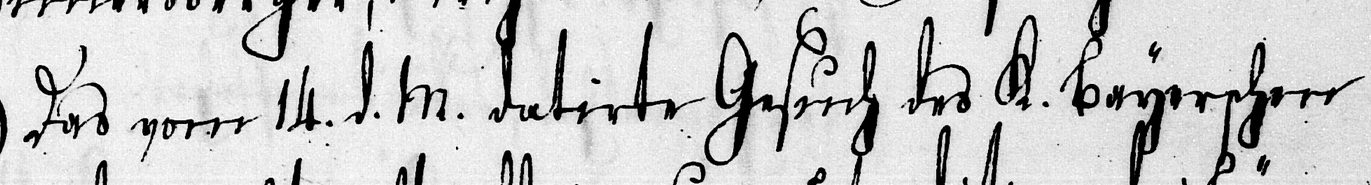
Das vom 14. d. M. datirte Gesuch des K. Bayerschen
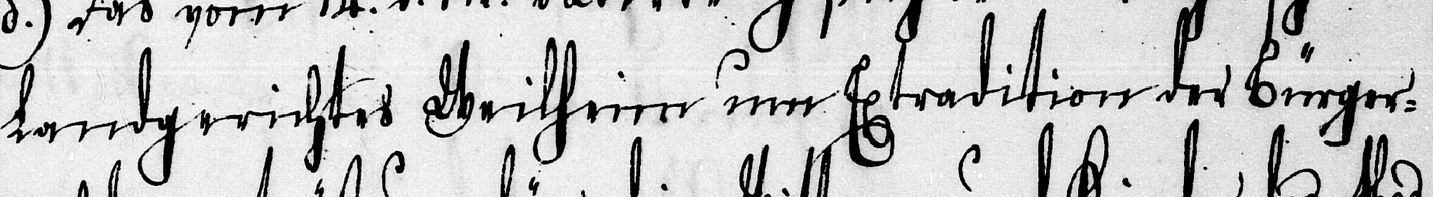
Landgerichtes Weilheim um Extradition der Bürger¬
